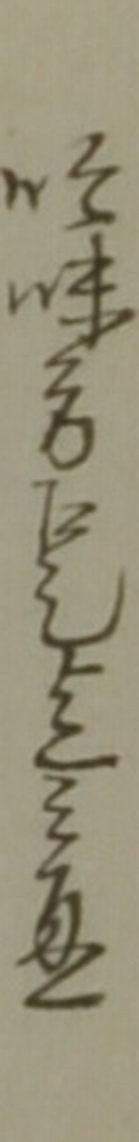吟味方是迄之通
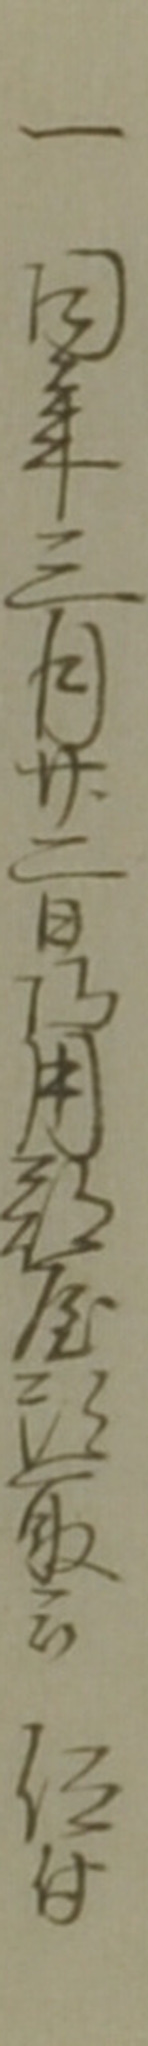一同年三月廿ニ日御用部屋頭取被仰付
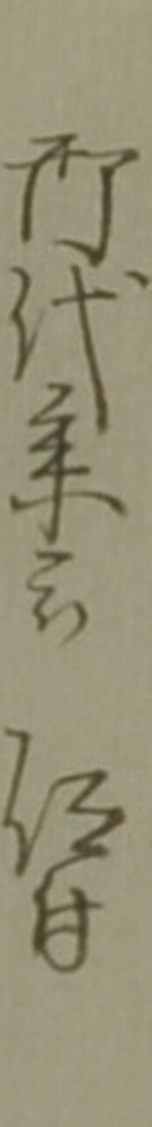御代参被仰付
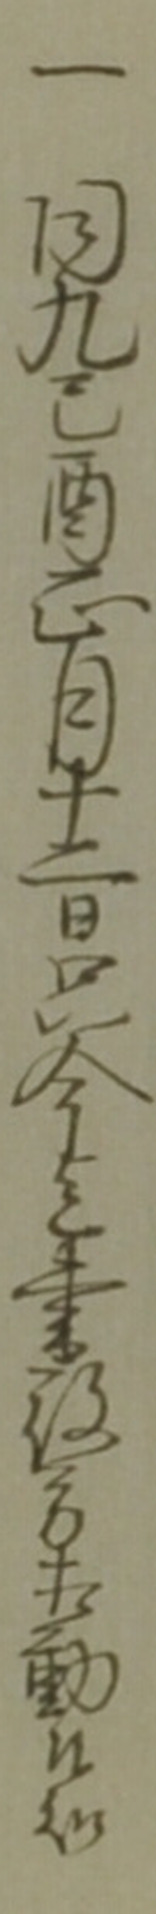一同九己酉正月十二日只今迄書役方相勤候処
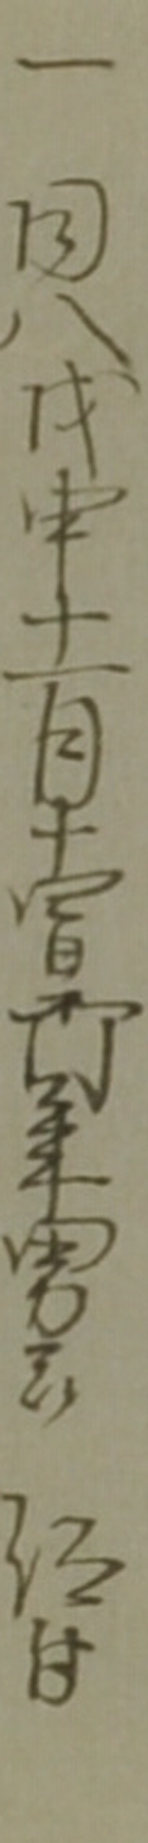一同八戊申十一月十四日御年男被仰付
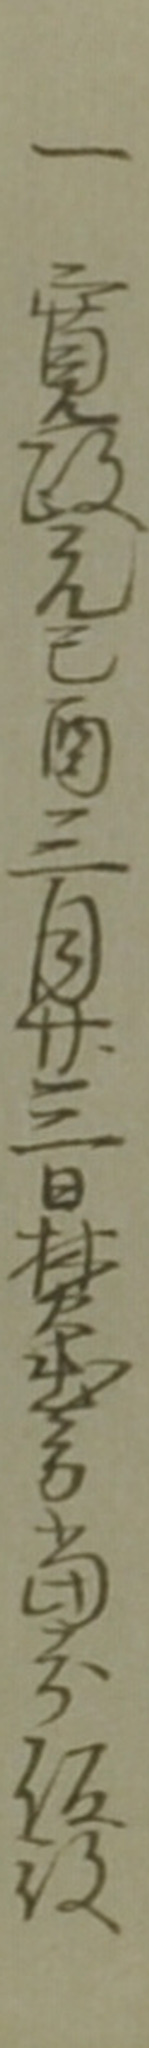一寛政元己酉三月廿三日焚出方当分仮役
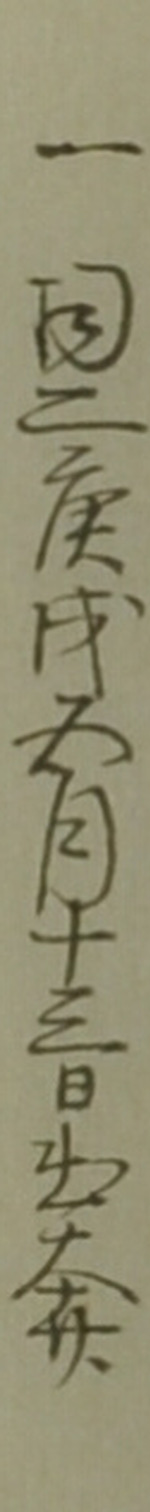一同二庚戌五月十三日出奔

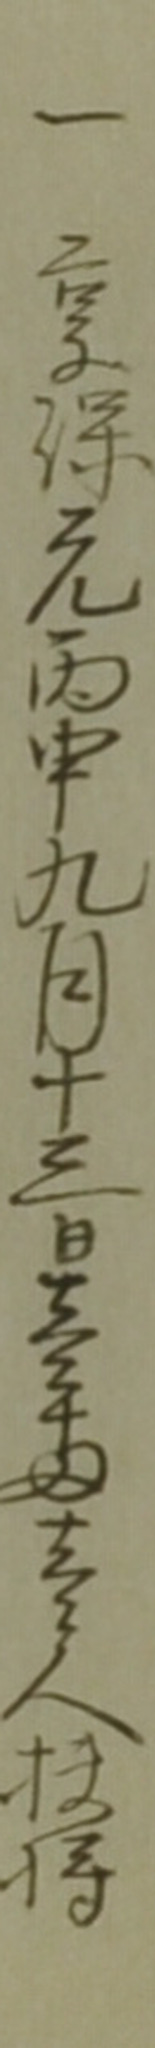一享保元丙申九月十三日壱両壱人扶持
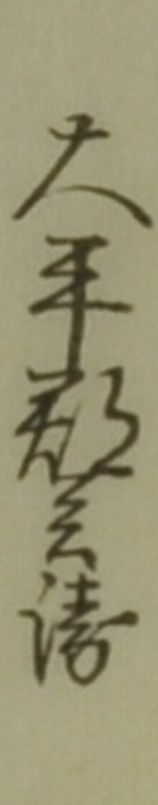大平郡兵衛
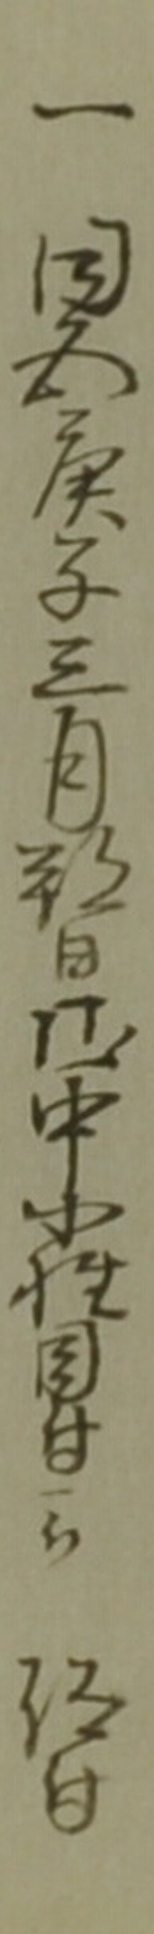一同五庚子三月朔日御中小性目付被仰付
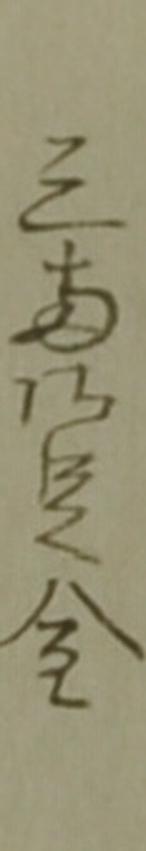三両御足金
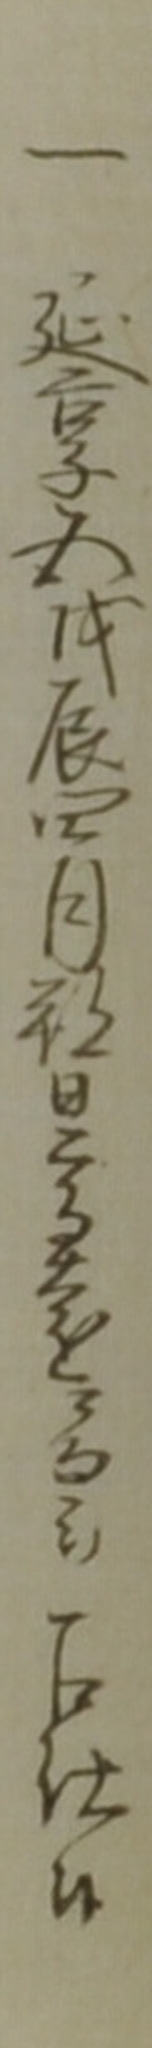一延享五戊辰四月朔日高遠ニ而被召仕候
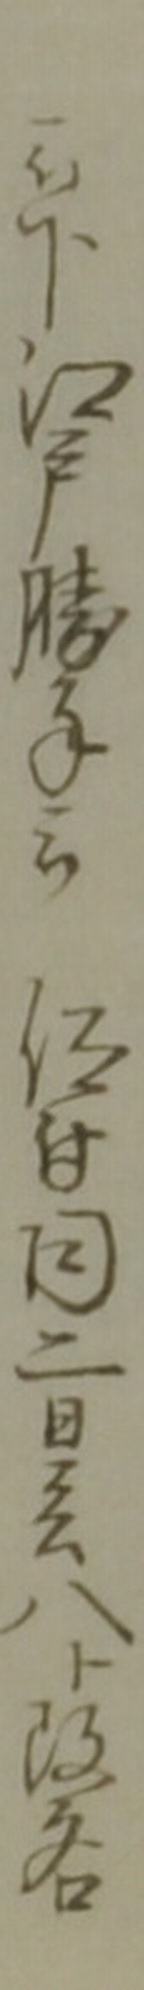被下江戸勝手被仰付同二日兵八改名
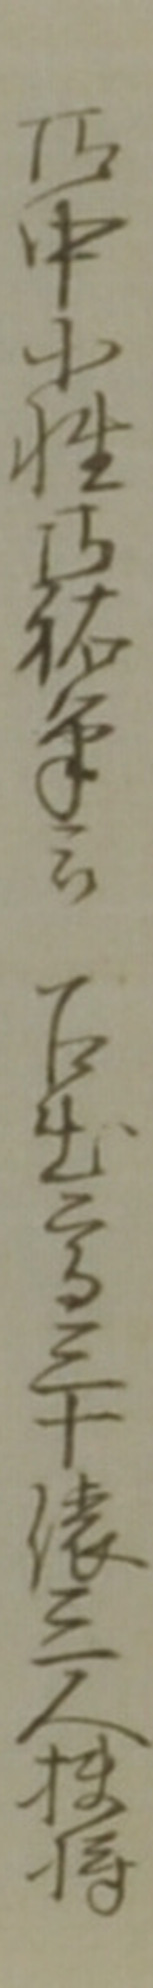御中小性御祐筆被召出高三十俵三人扶持

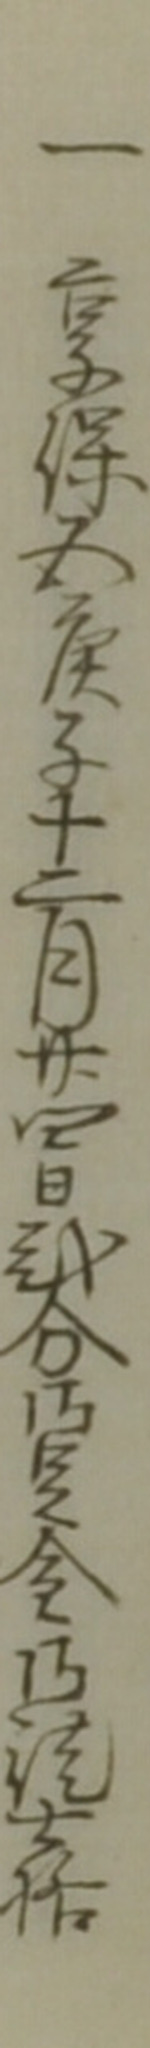一享保五庚子十二月廿四日弐分御足金御徒士格
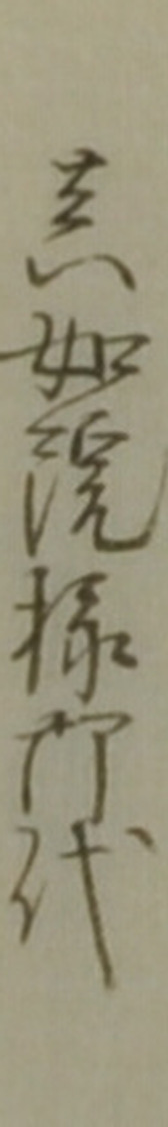真如院様御代
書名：無足廃家（弐）
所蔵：伊那市立高遠町図書館・合同会社AMANE
